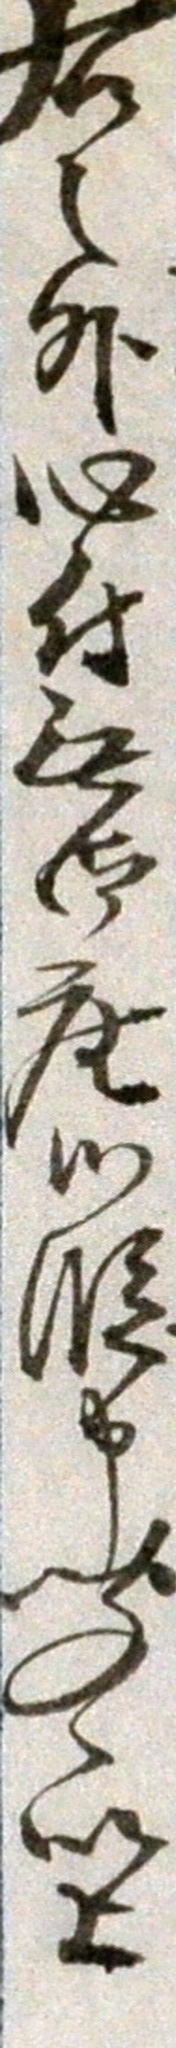右之外心付無御座候段申聞候以上
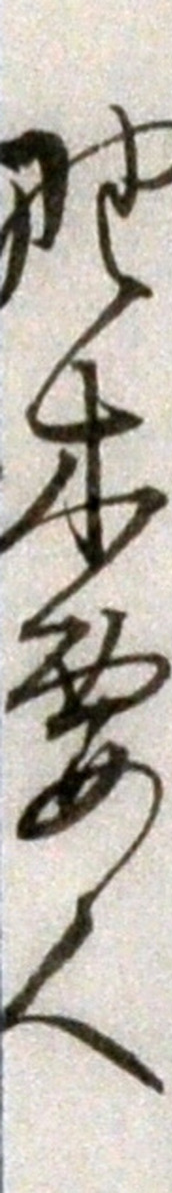野木要人
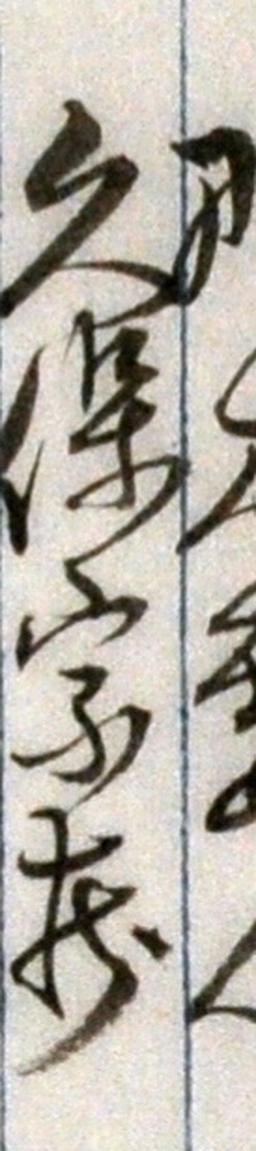久保宗蔵
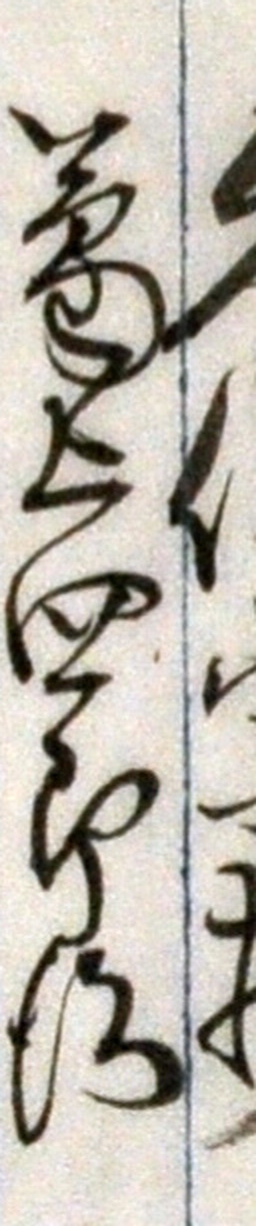葛上四郎治
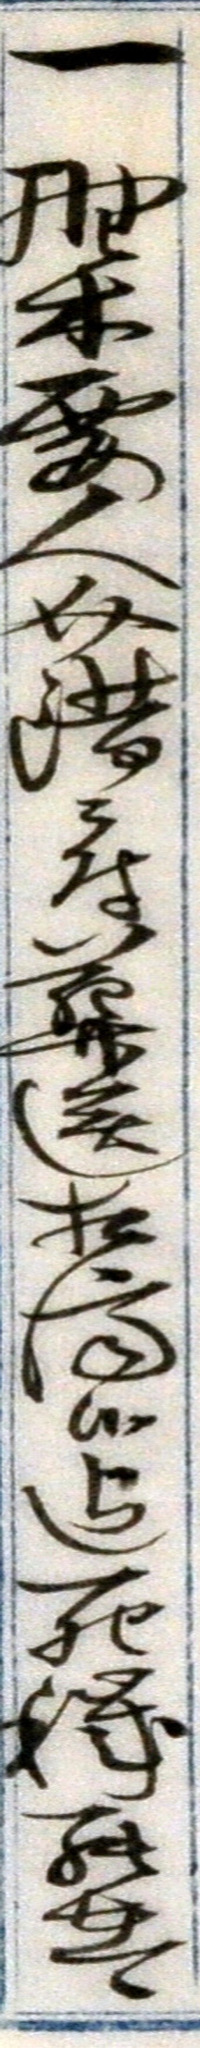一野木要人介錯ニ付葬送相済候迄死穢罷在候
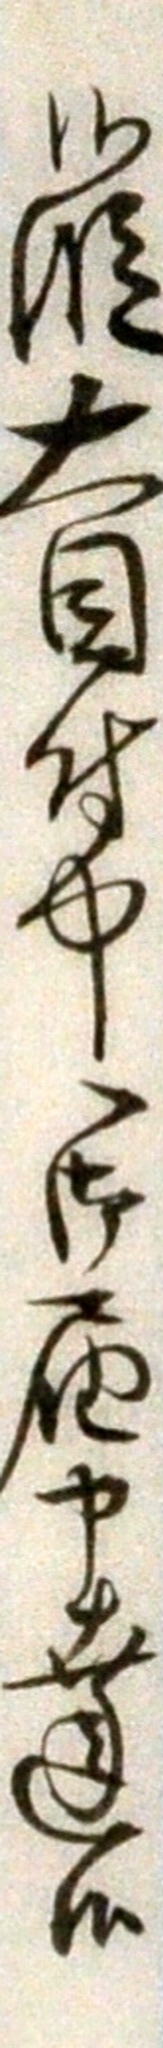候段大目付中へ御届申達候
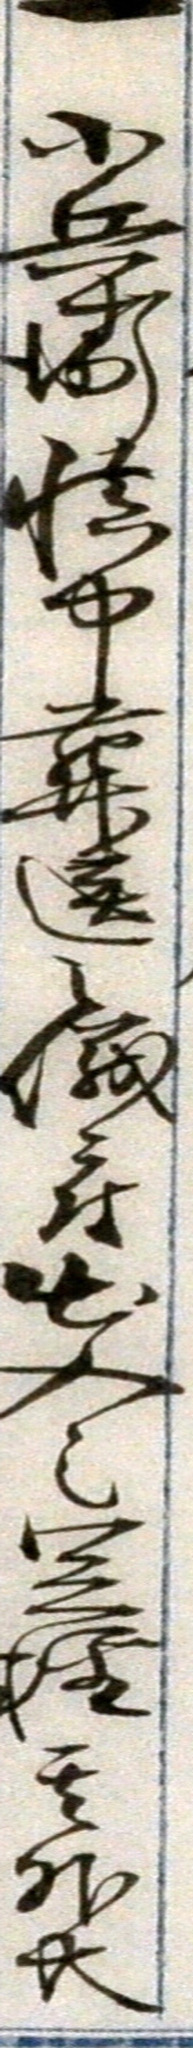一小兵衛慎中葬送之儀ニ付出入之足軽其外共
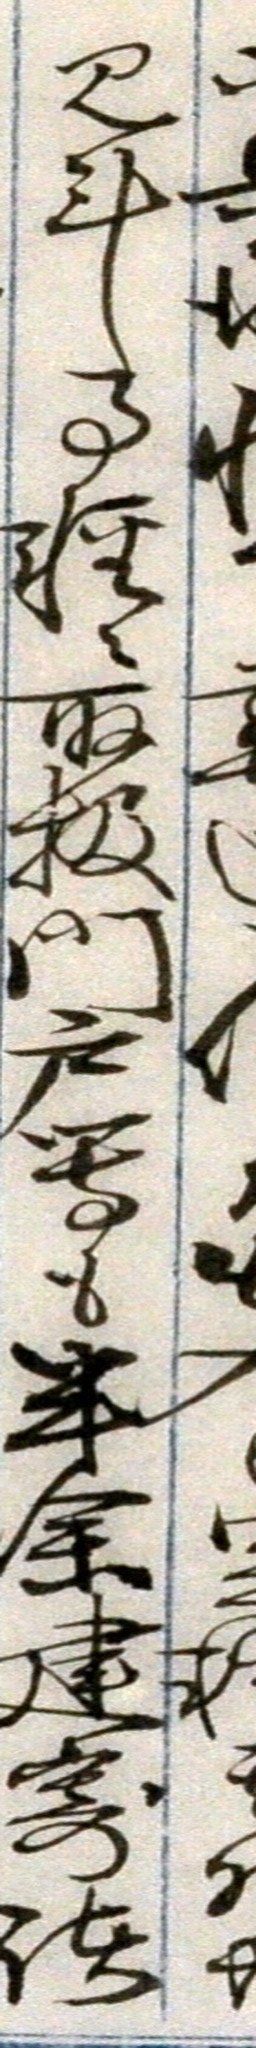見斗事輕ニ取扱門戸等も半余建寄諸
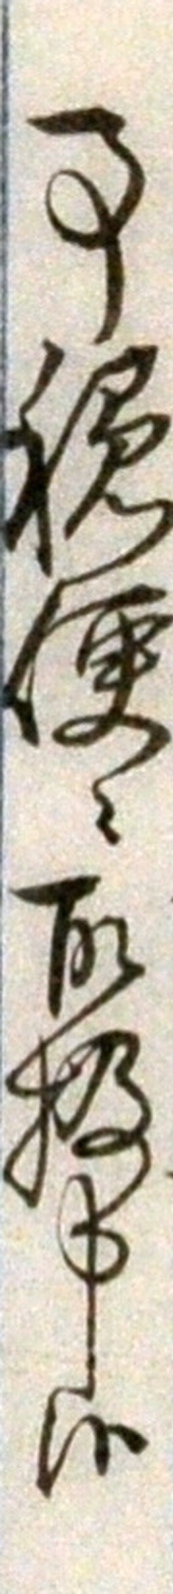事穏便ニ取扱申候
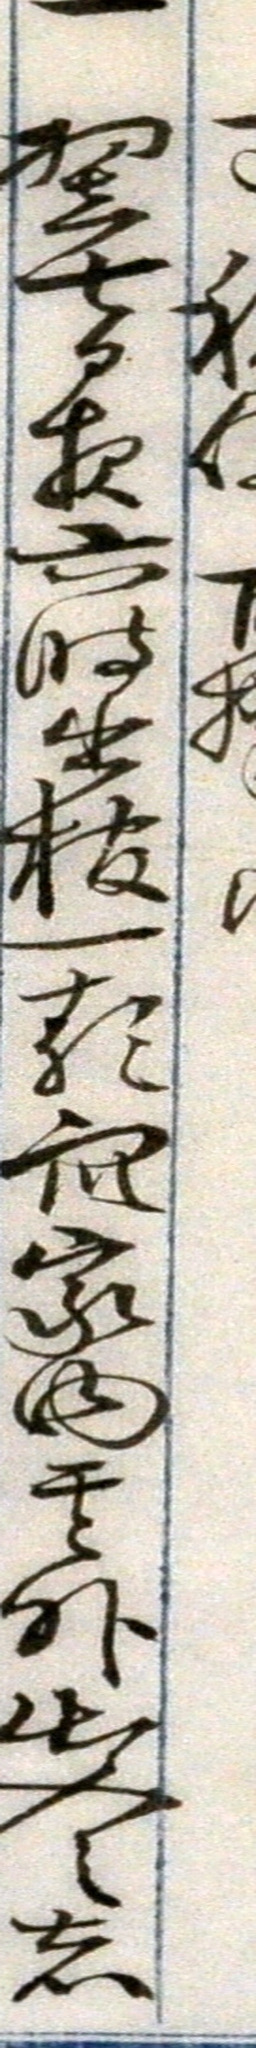一翌七日夜六時出棺一類衆家内其外出入之者
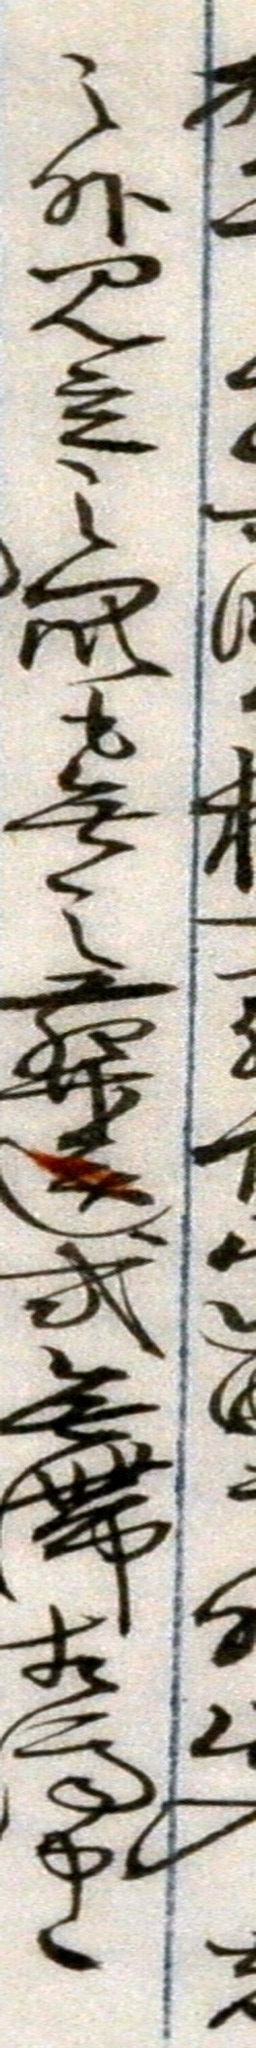之外見立之衆も無之葬送式無滞相済申候
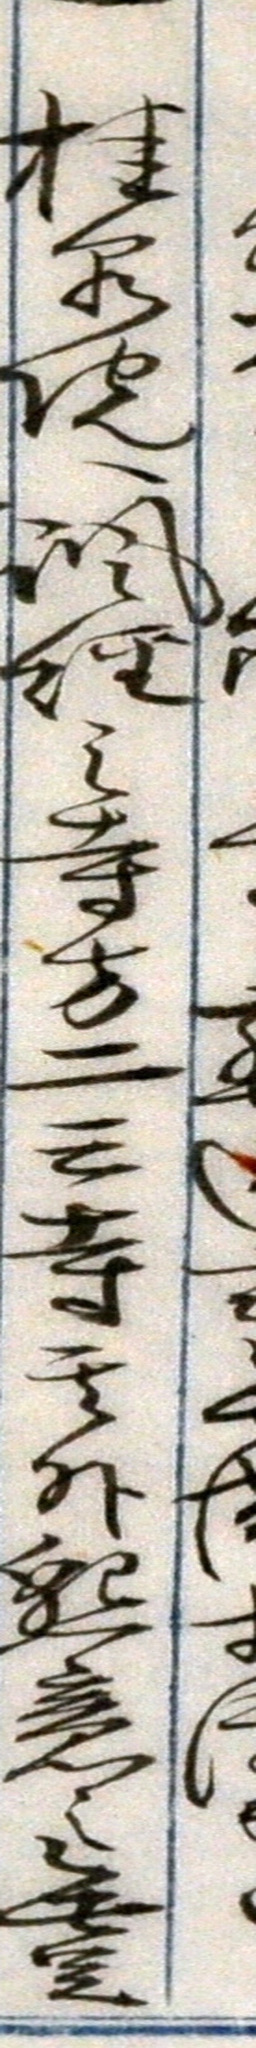一桂泉院へ諷経之寺方二三寺其外懇意之無足
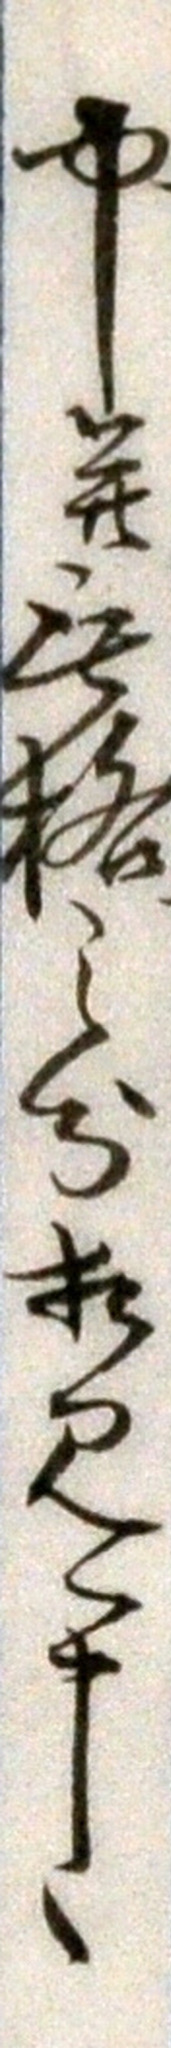中幷無格之分相見へ申候
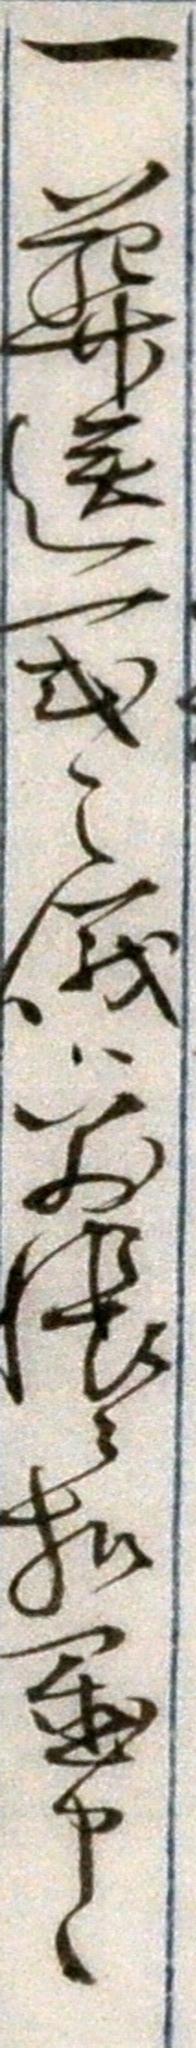一葬送一式之儀ハ別帳ニ控置申候
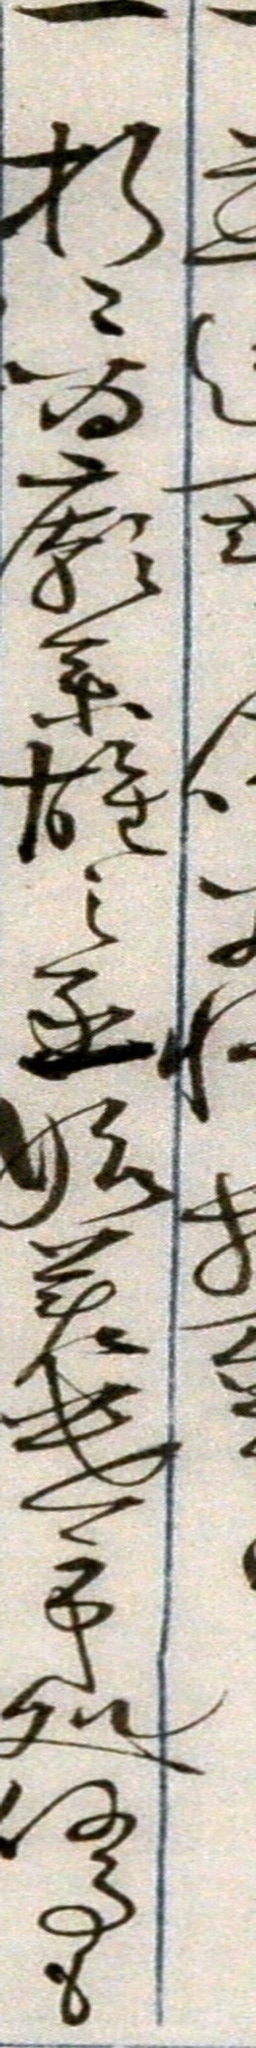一折々為廟参雄之丞始差遣可申処何事も
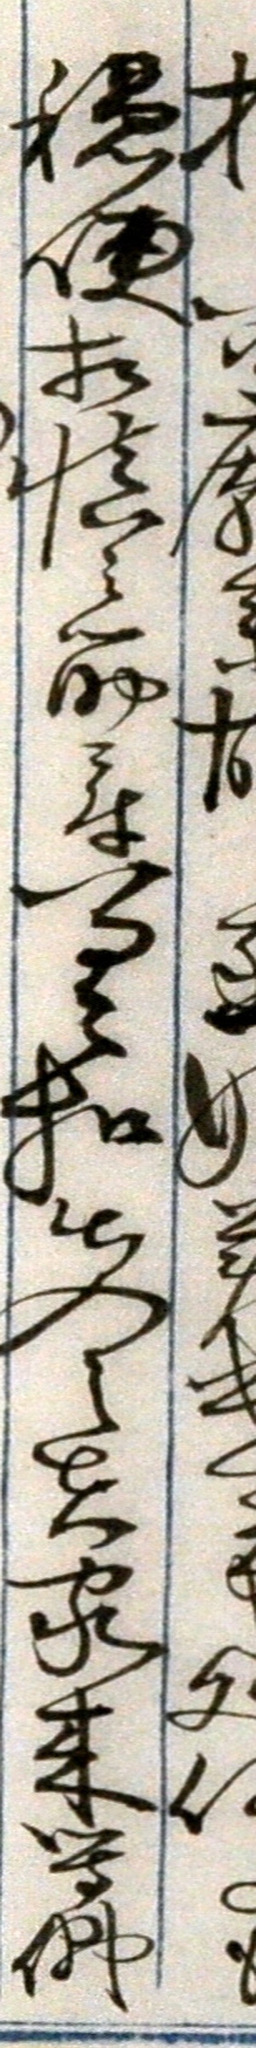穏便相慎之筋ニ付差扣出入之者家来等仏
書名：川面小藤太子細有之多賀谷唯右衛門ヲ打果候一件
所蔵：伊那市立高遠町図書館・合同会社AMANE
